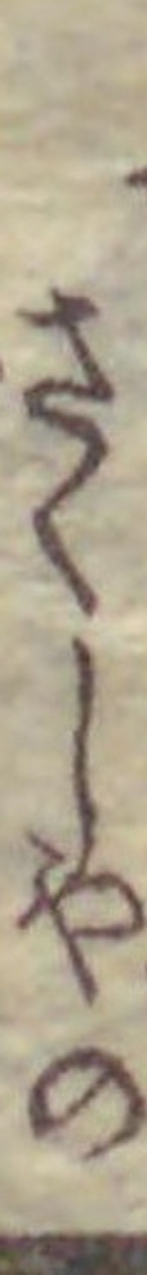さくしやの
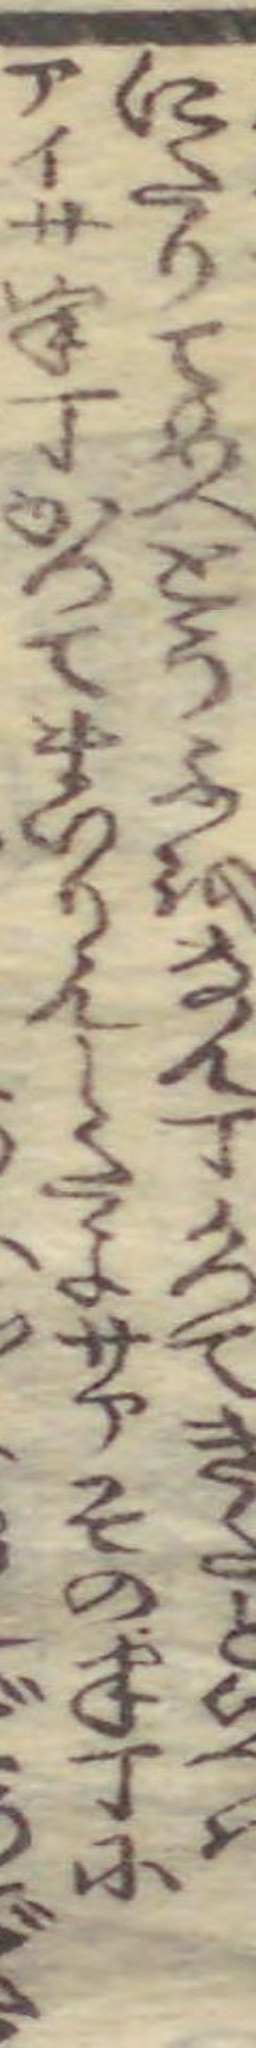アイサ半丁かつてまいりんしたよサアその半丁に
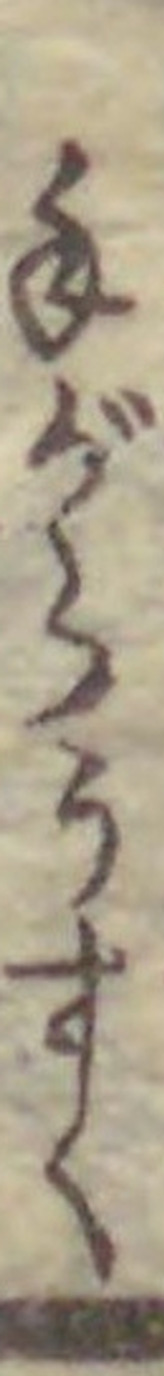手がらうすく
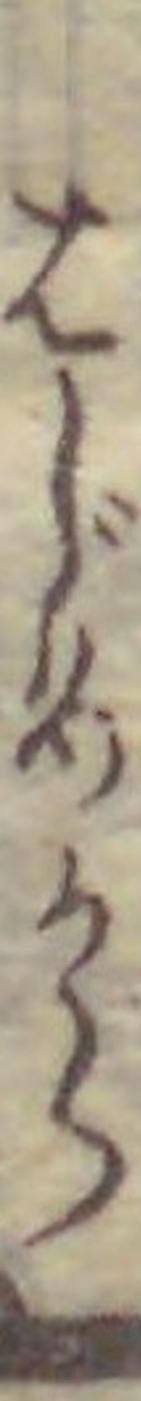はじめから
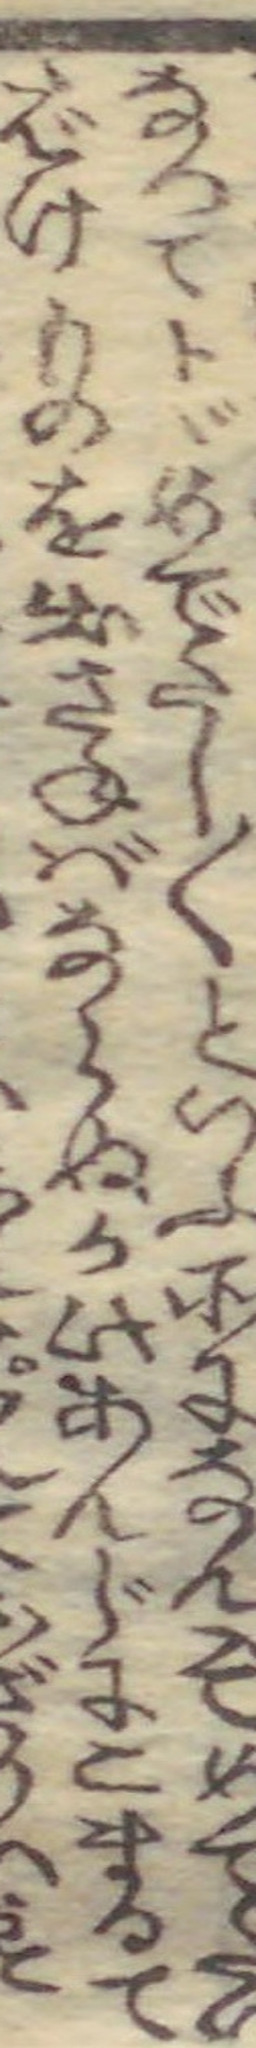ばけものを出さねばならぬか此あんじにこまるて
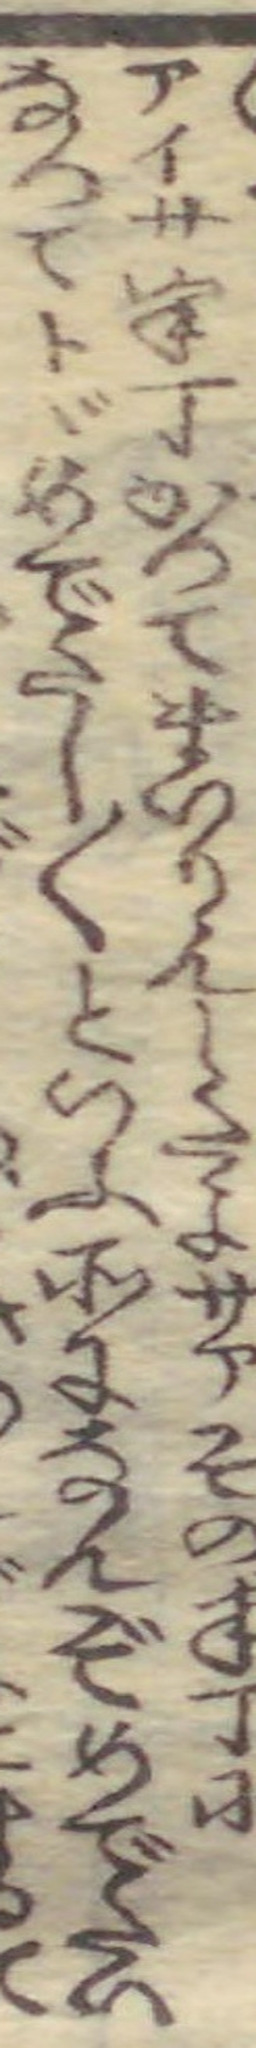なつてトヾめでたし〳〵といふ所になんぞめでたい
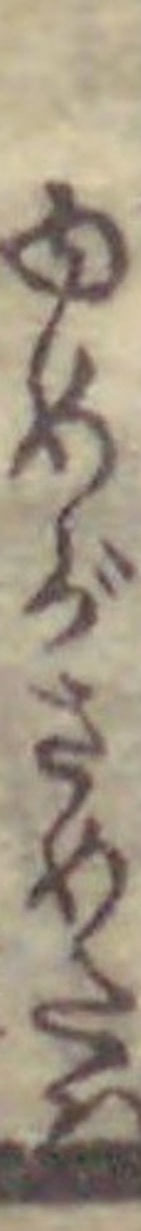ゆめがさめたは
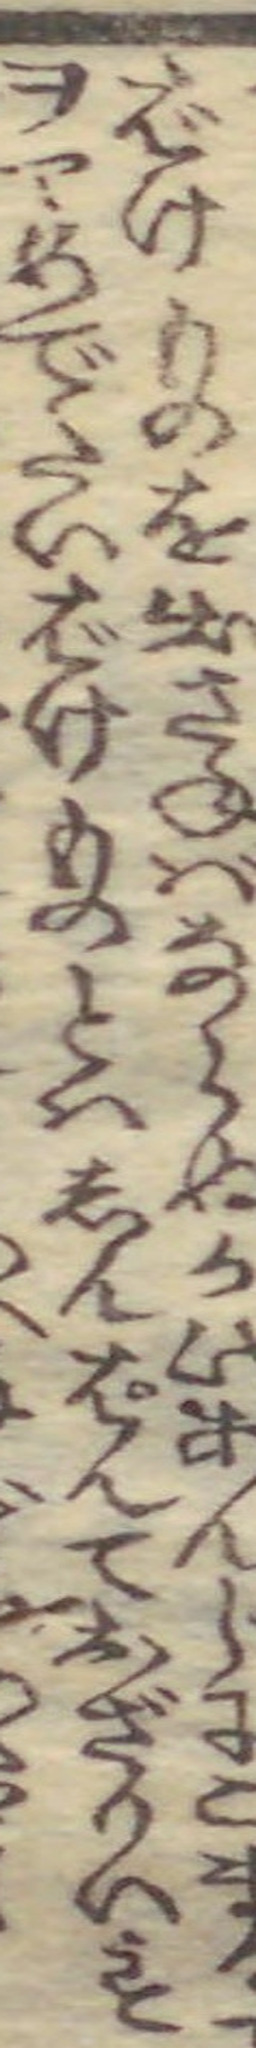ヲヤめでたいばけものとはしんぱんておざりいす
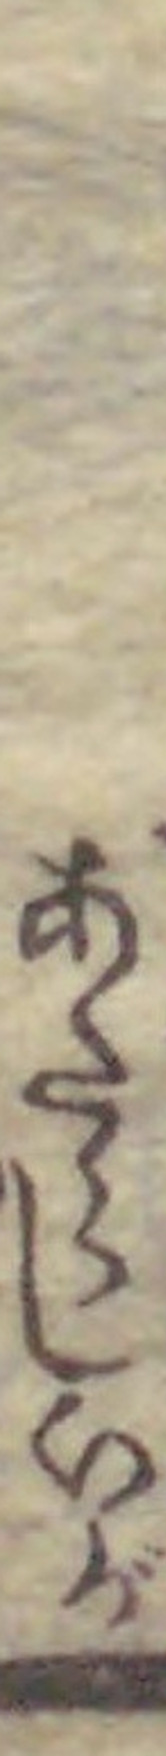あたらしいが
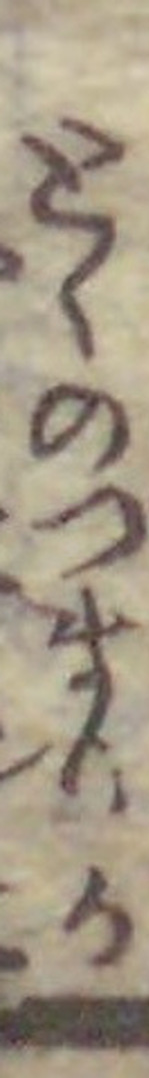とゝのつまりか
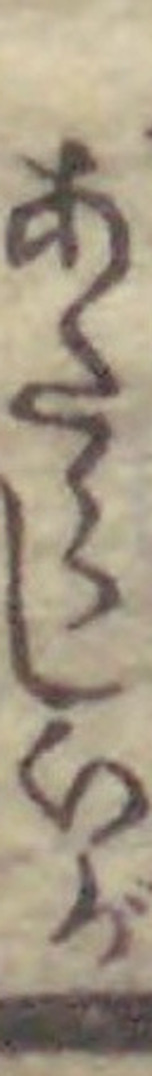あたらしいが
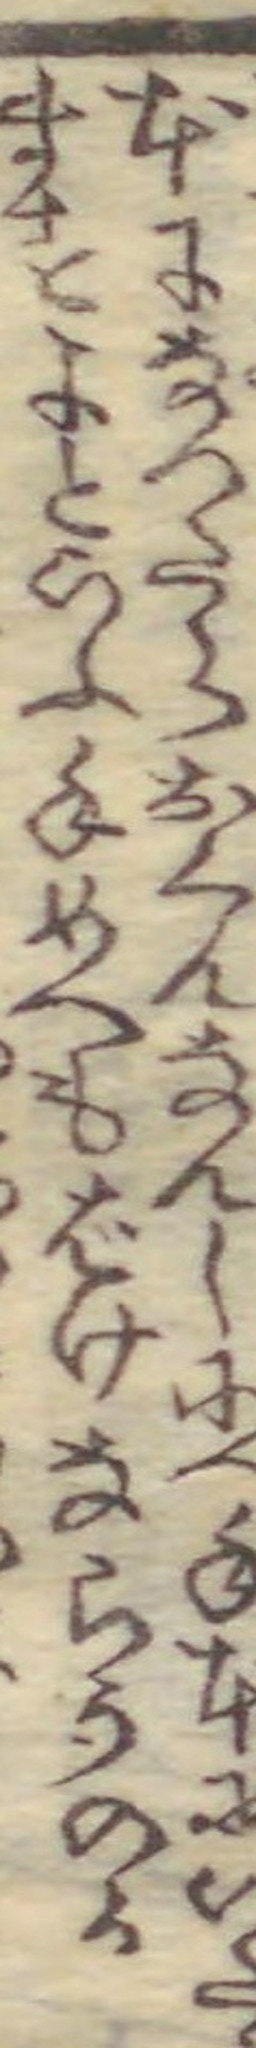ますよといふ手めへもばけならうのか
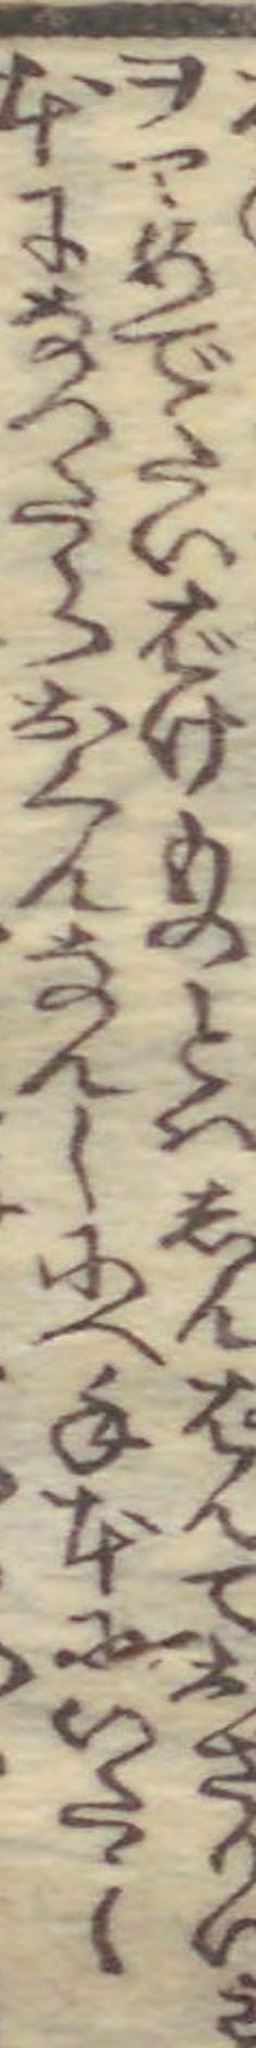本になつたらおくんなんしふへ手本にいたし
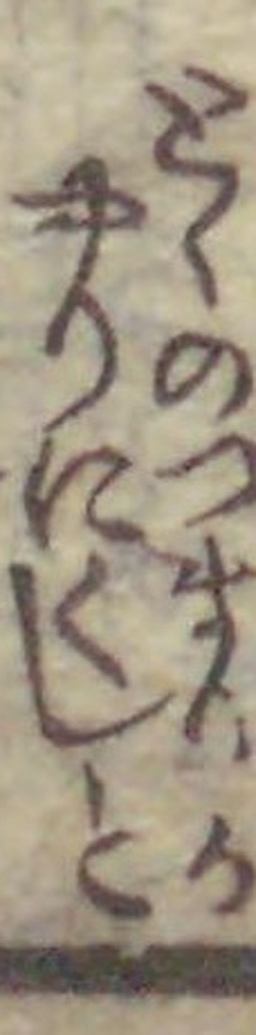やりにくしと
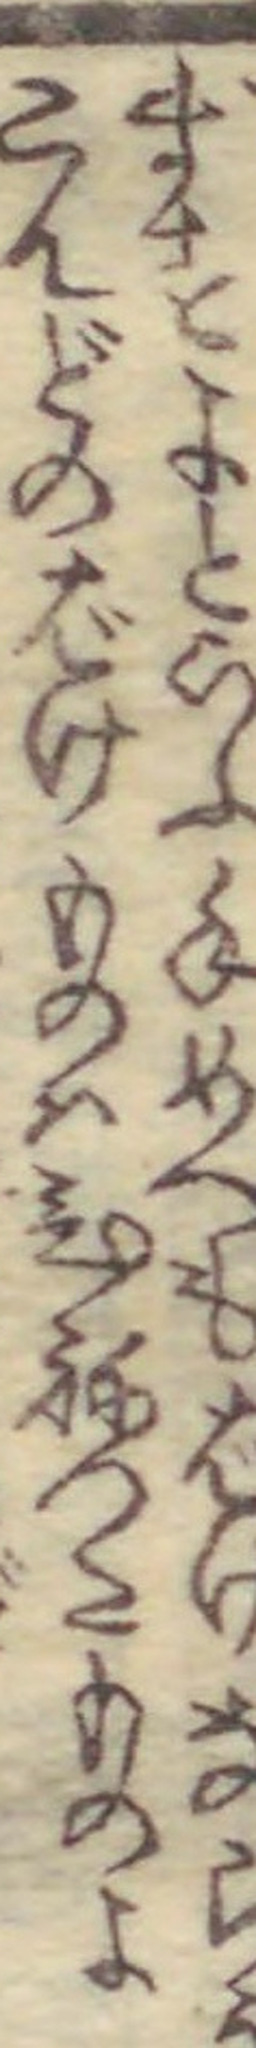こんどのばけものはひねつたものよ
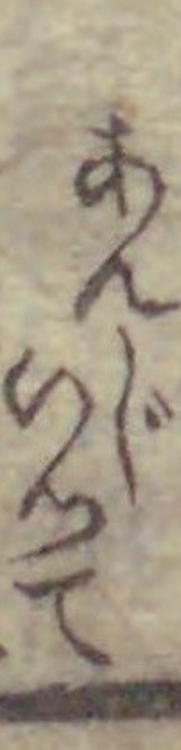あんじいつて
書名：大時代唐土化物 3巻. 曽我太夫染
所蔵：国立国会図書館 National Diet Library, JAPAN
